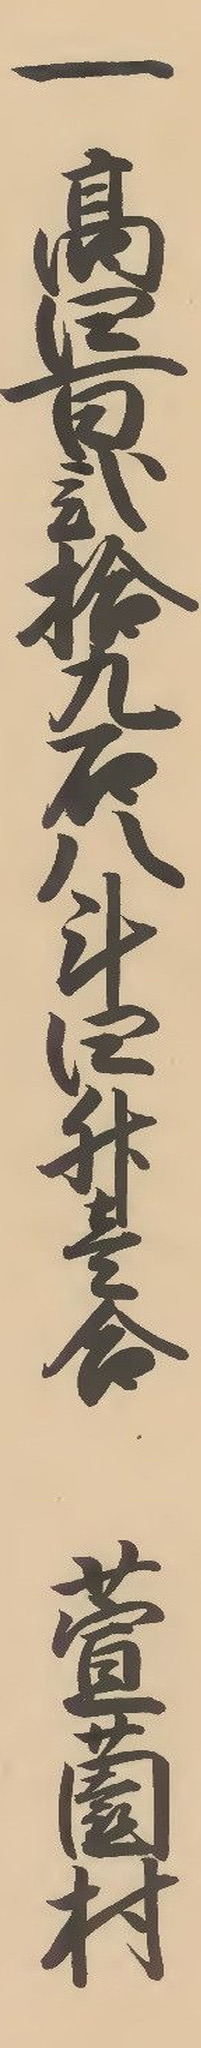一高四百弐拾九石八斗四升壱合萱園村
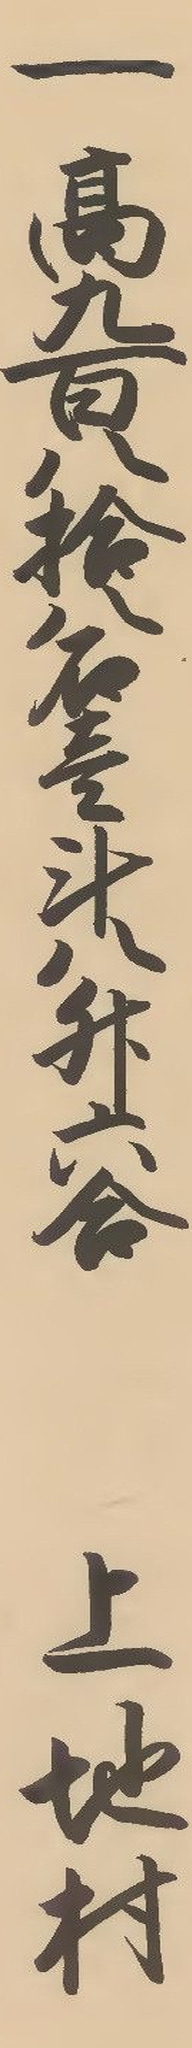一高九百八拾八石壱斗八升六合上地村
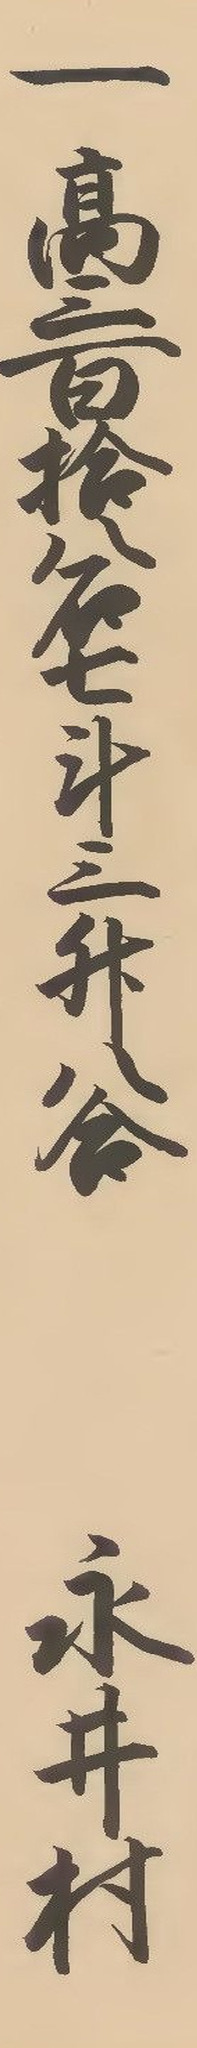一高三百拾八石七斗三升八合永井村
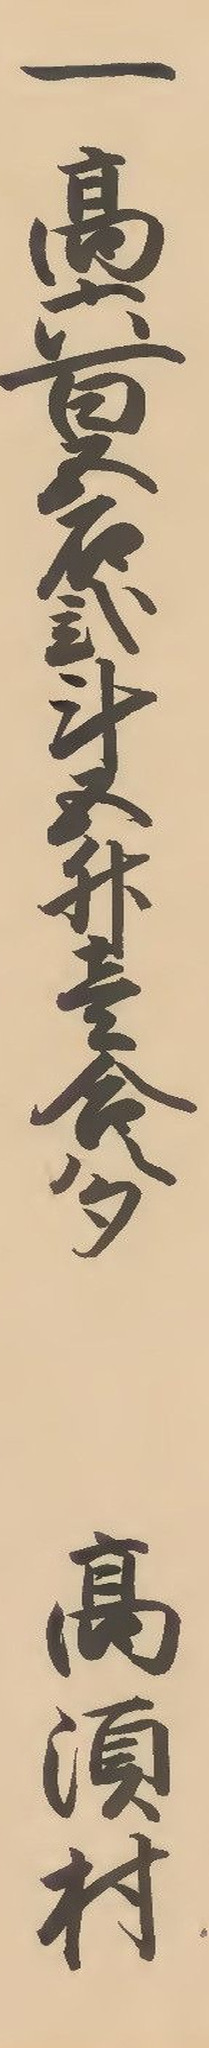一高六百五石弐斗五升壱合八勺高須村
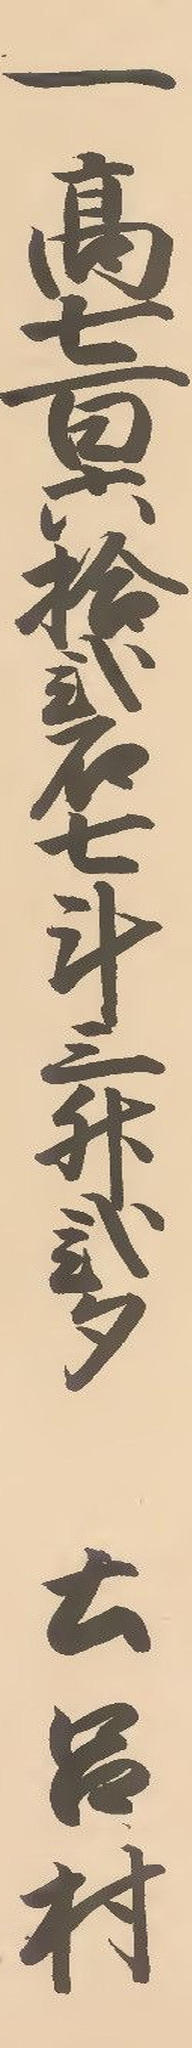一高七百六拾弐石七斗三升弐勺土呂村
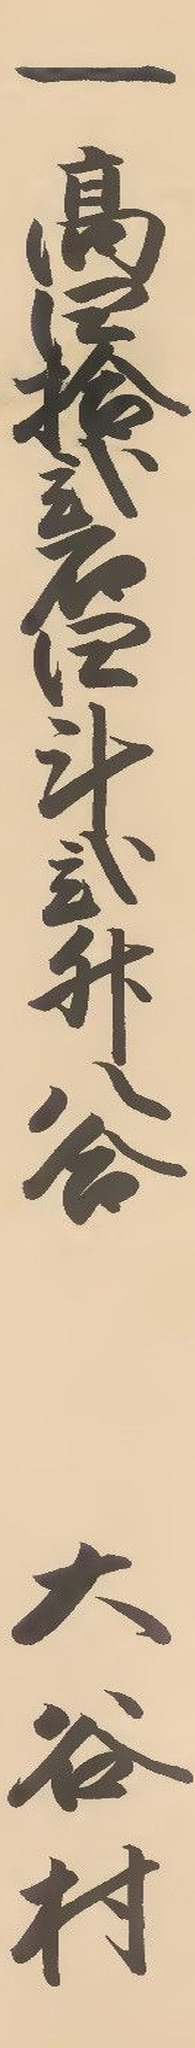一高四拾弐石四斗弐升八合大谷村
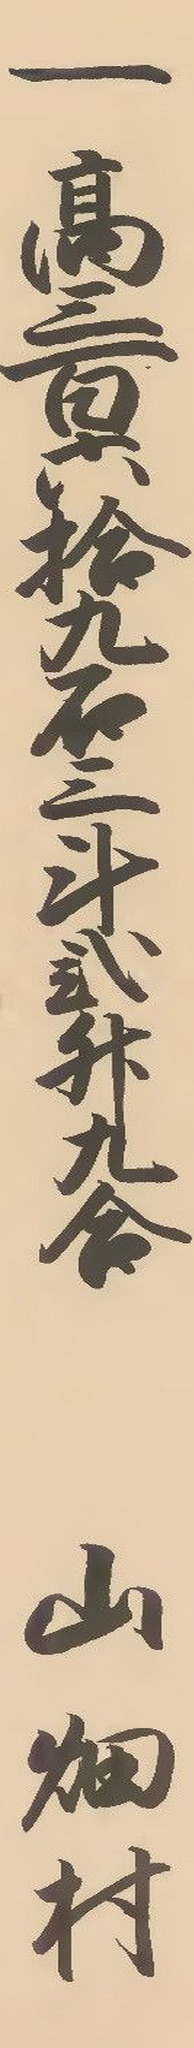一高三百六拾九石三斗弐升九合山畑村
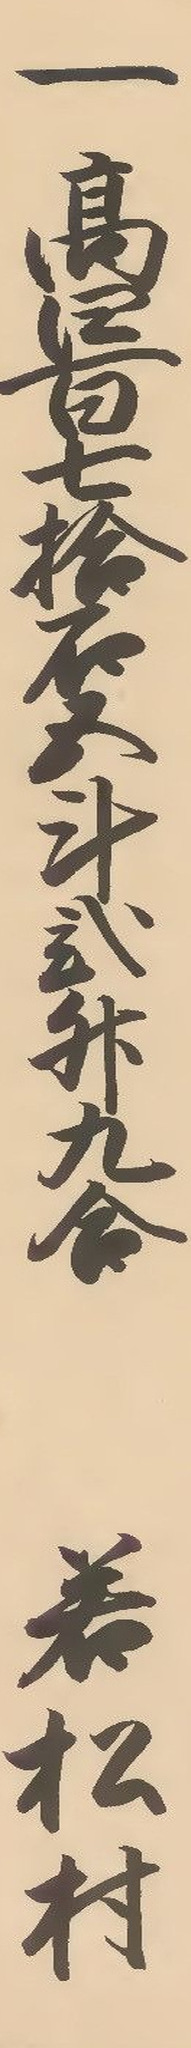一高四百七拾石五斗弐升九合若松村

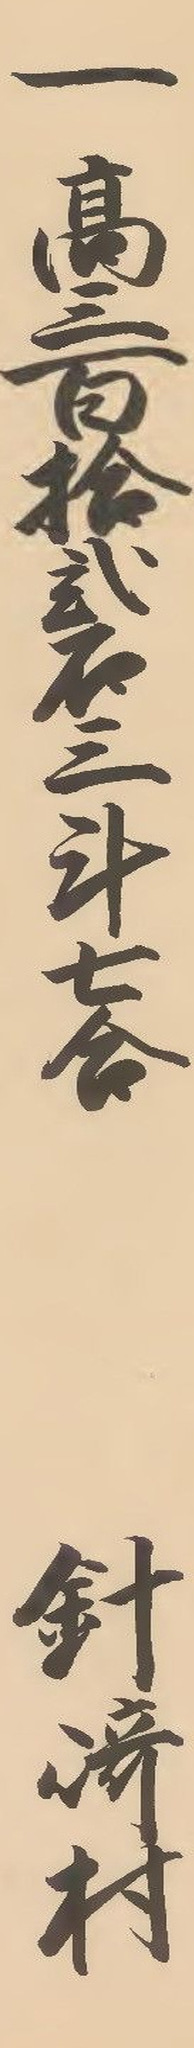一高三百拾弐石三斗七合針崎村
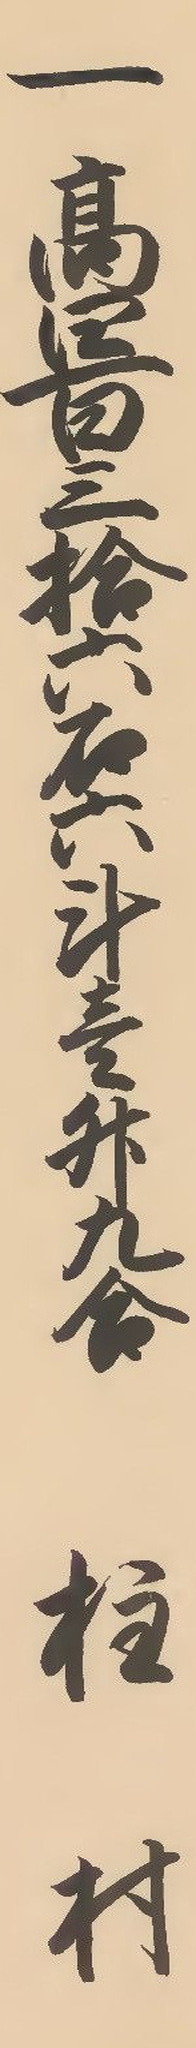一高四百三拾六石六斗壱升九合柱村
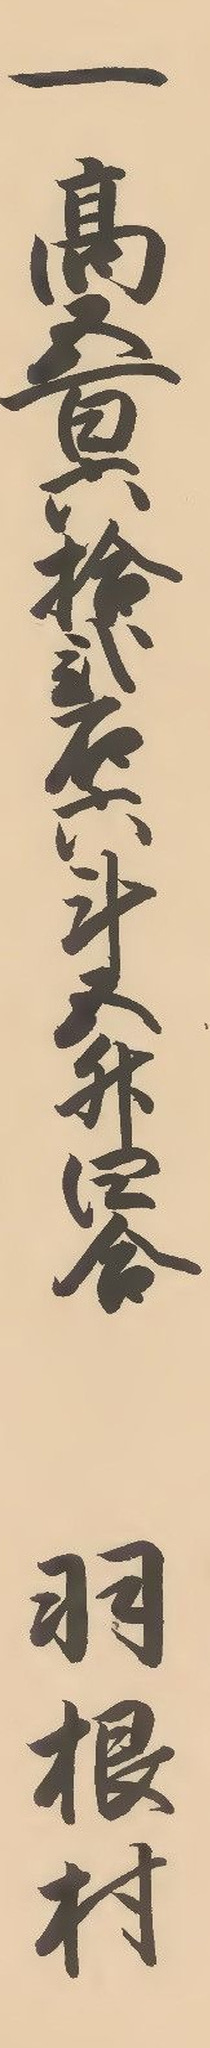一高五百六拾弐石六斗五升四合羽根村
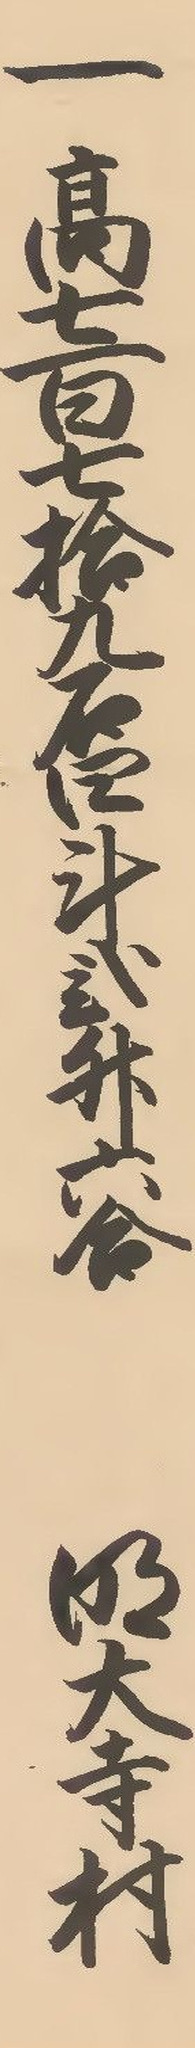一高七百七拾九石四斗弐升六合明大寺村
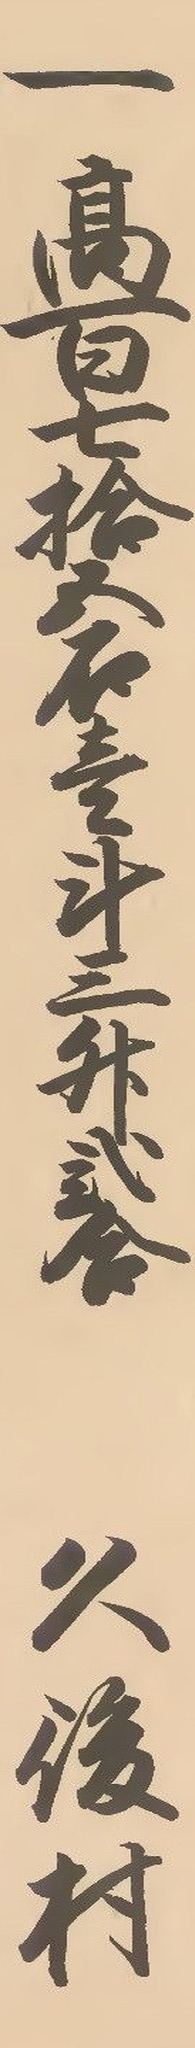一高百七拾五石壱斗三升弐合久後村
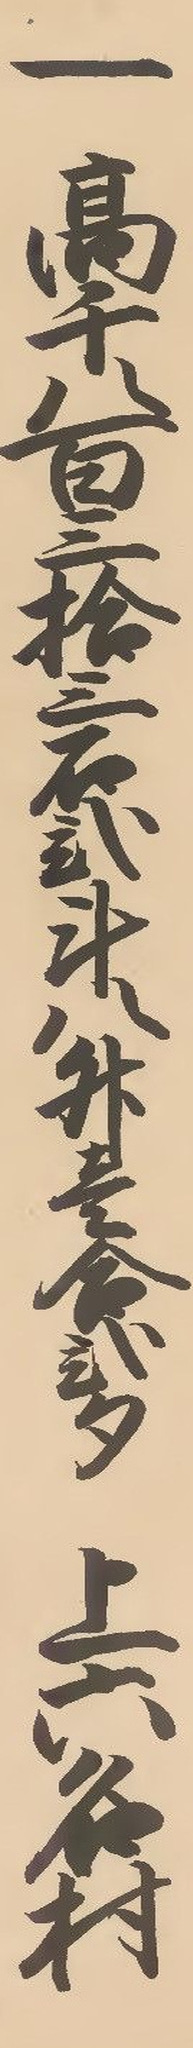一高千八百三拾三石弐斗八升壱合弐勺上六名村
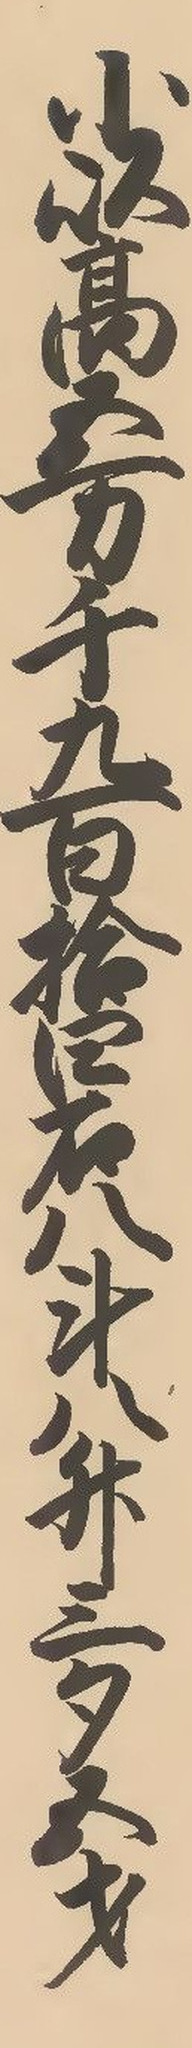小以高五万千九百拾四石八斗八升三勺五才

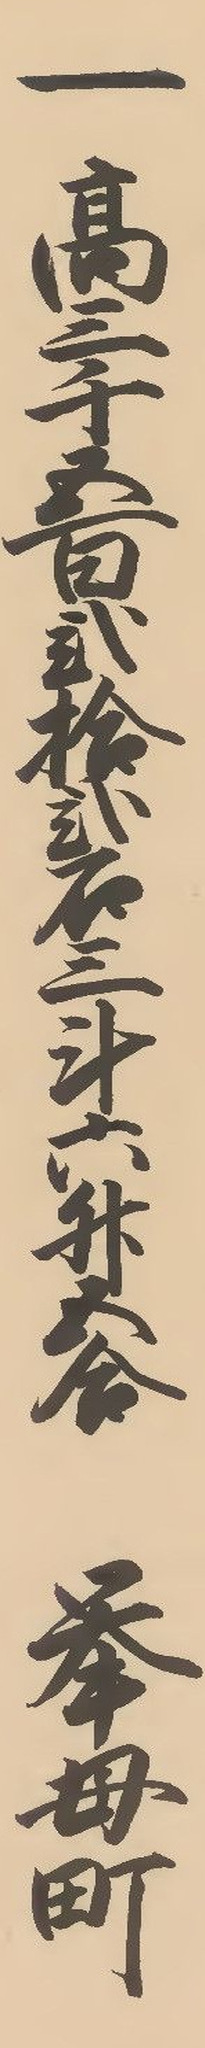一高三千五百弐拾弐石三斗六升五合挙母町
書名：三河国郷帳
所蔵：国立公文書館 National Archives of Japan
